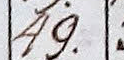49.
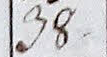38
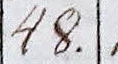48.
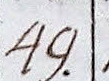49.
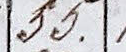55.
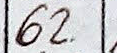62
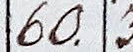60.
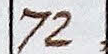72
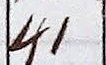41
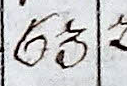63
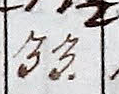33.
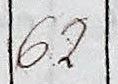62
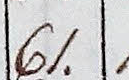61.
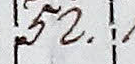52.
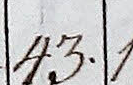43.
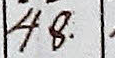48.
